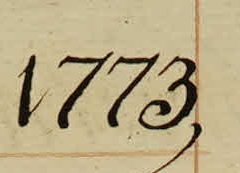1773,
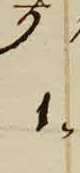1
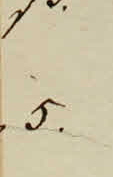5.
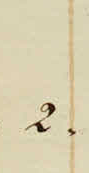2
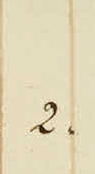2
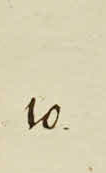10.
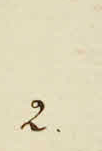2.
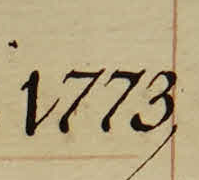1773
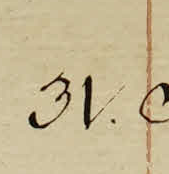31.
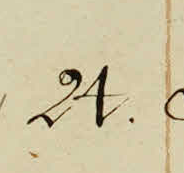24.
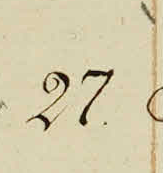27.
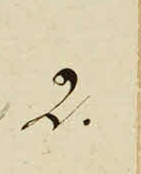2.
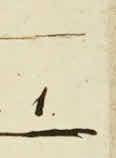1.
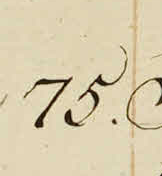75.
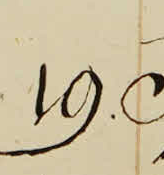19.
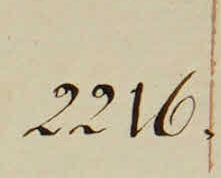2216
